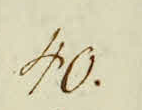40.
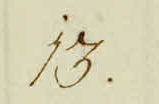13.
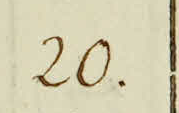20.
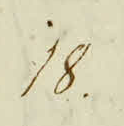18.
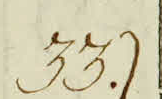33.
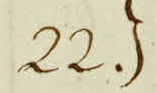22.
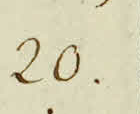20.
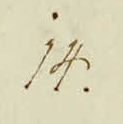14.
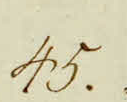45.
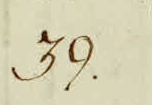39.
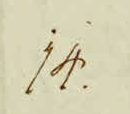14.
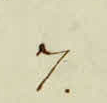7.
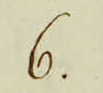6.
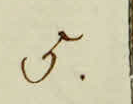5.
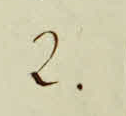2.
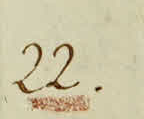22.
